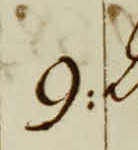9:
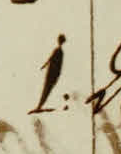1:
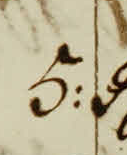5:
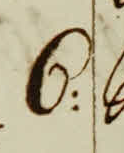6:
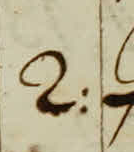2:
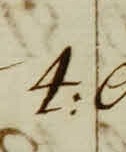4:
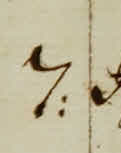7:
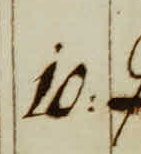10:
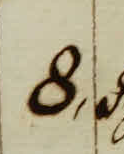8,
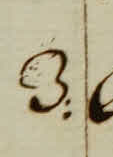3:
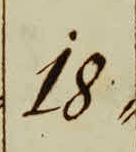18
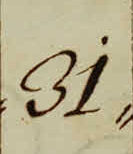31
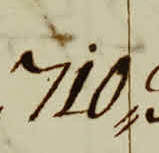710
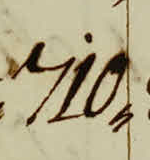710
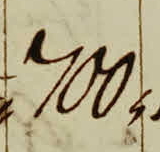700
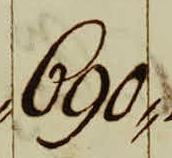690
